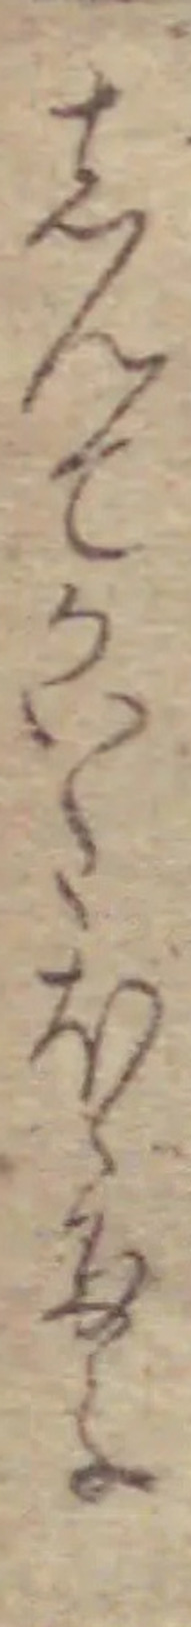しんてかいたほゝたよ

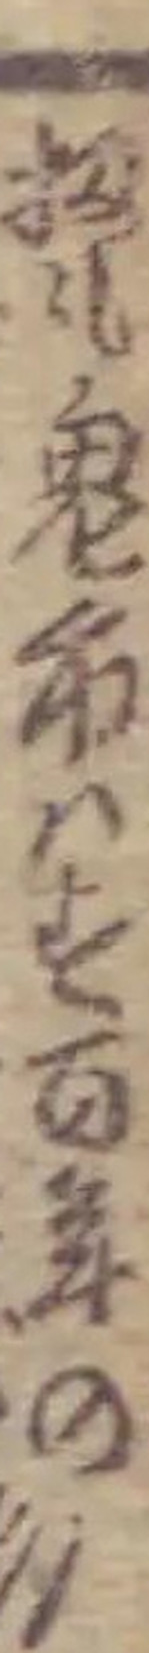扨も鬼市はす百年の
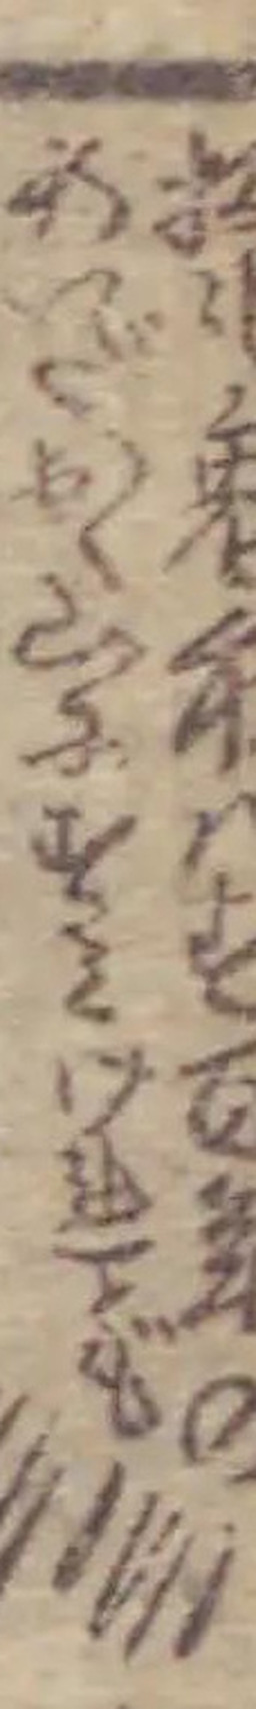あいだおく山にすみけれども
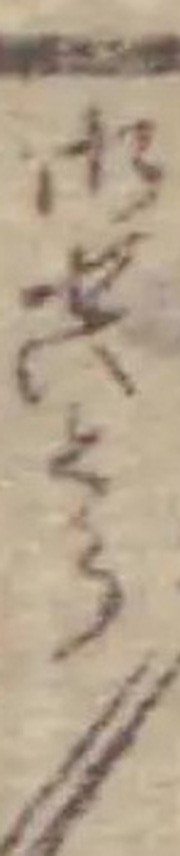御せいとう
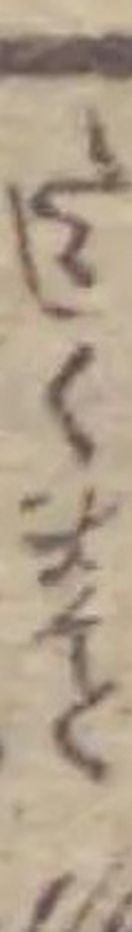たゝしくまこと
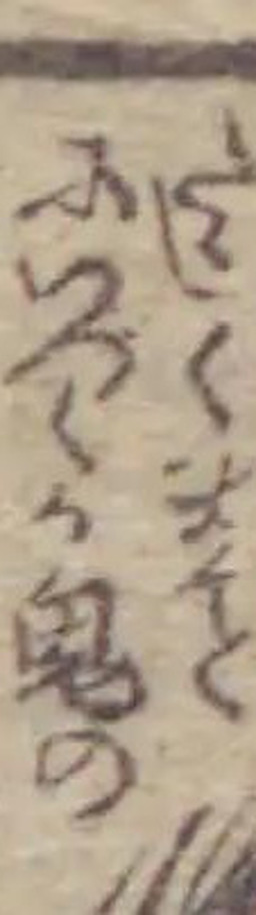にいつくか鬼の
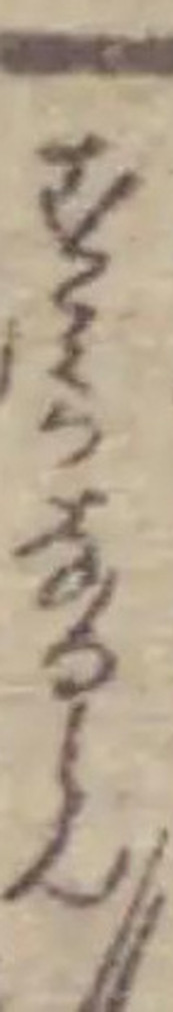すみかなるらん
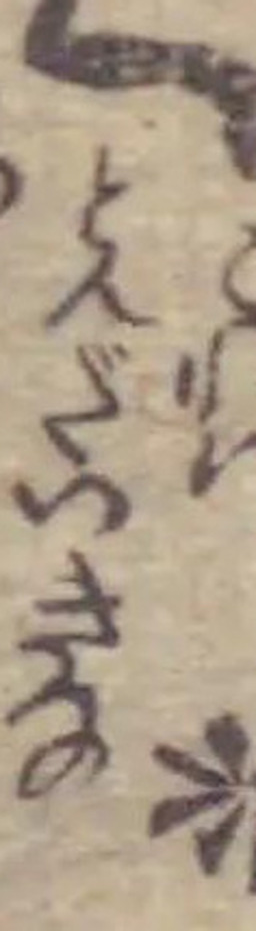とんだいきな
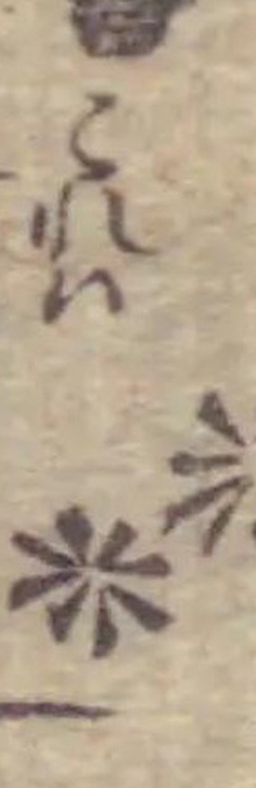これは
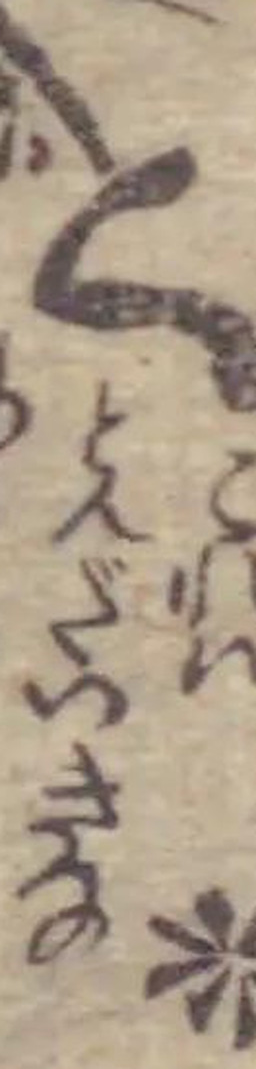とんだいきな
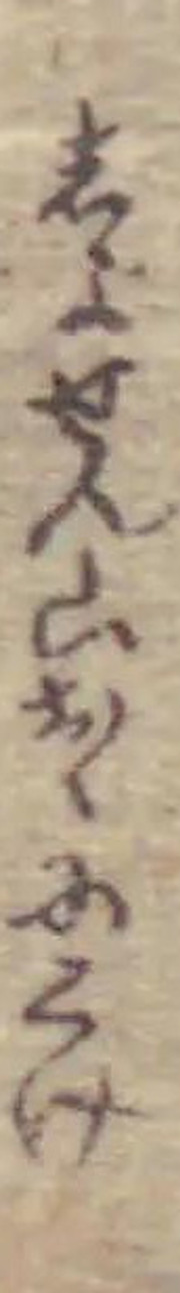しよせん山おくにこけ
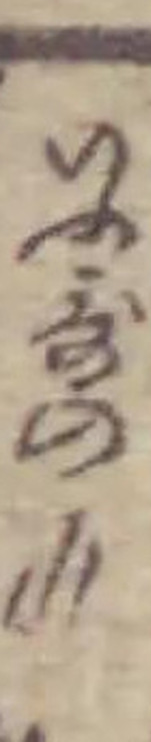いふ歌の
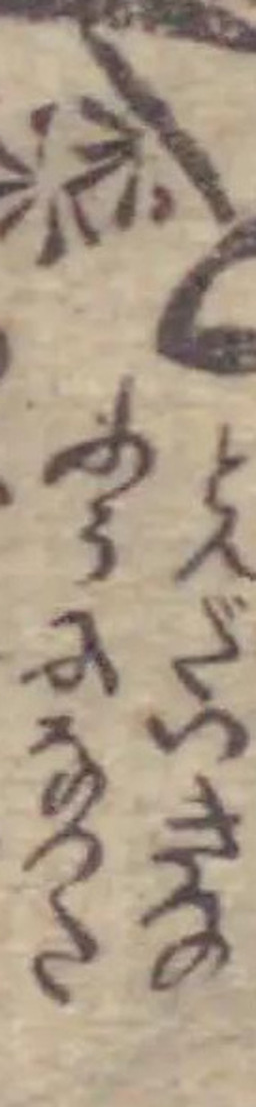ふうになつた
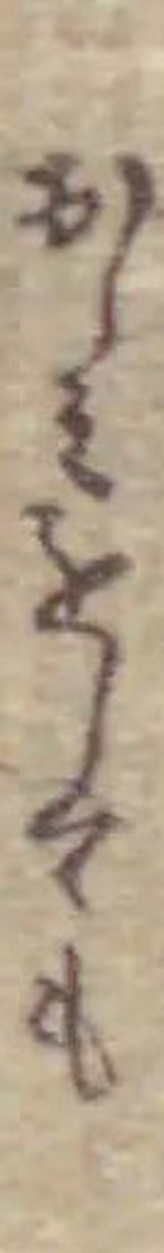おしみをしても
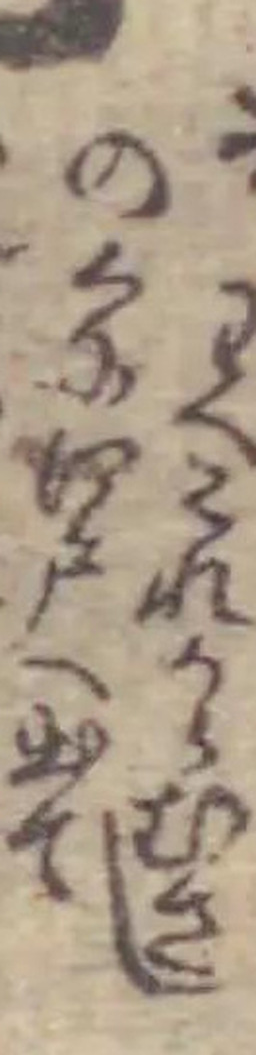のくに江戸へ出て
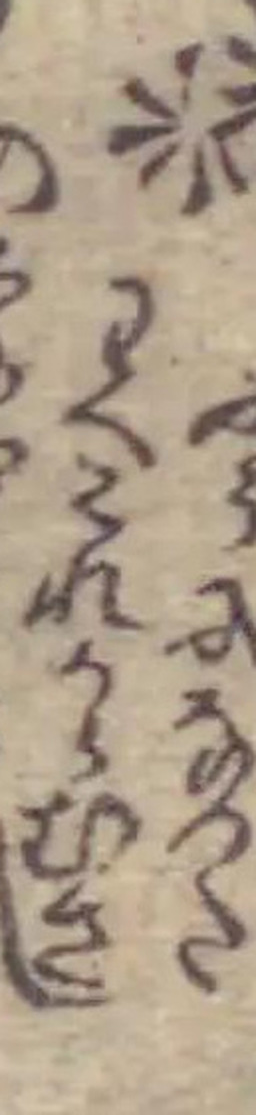わへこれからむさし
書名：鬼子宝 3巻
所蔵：国立国会図書館 National Diet Library, JAPAN
